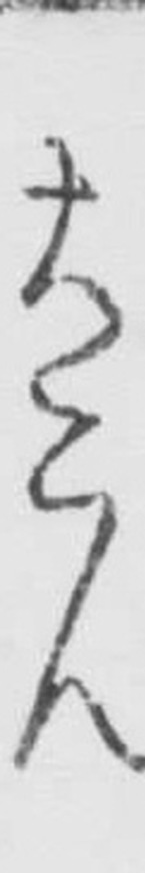大こん
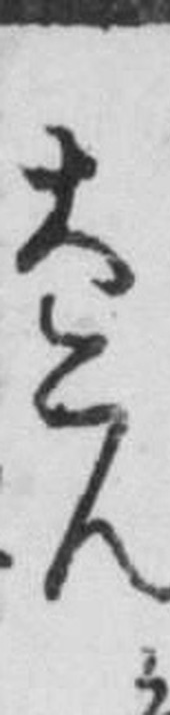大こん

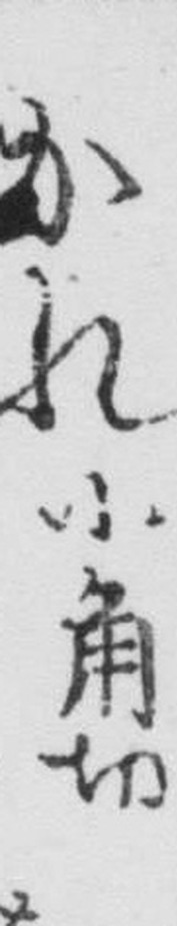かれ小角切
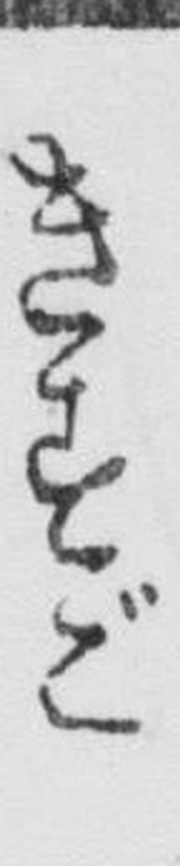きすご
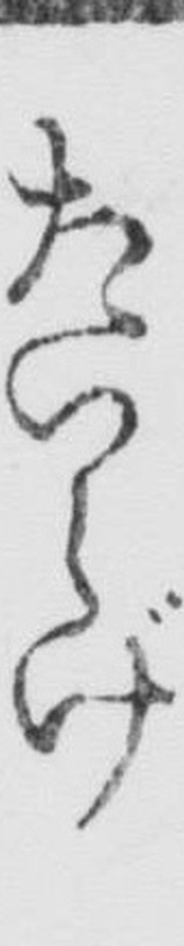たいらげ
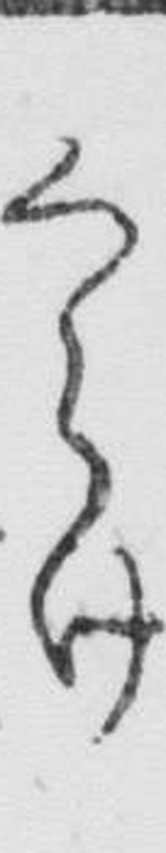くらけ
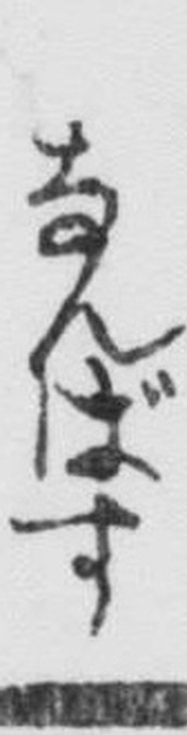なんばす
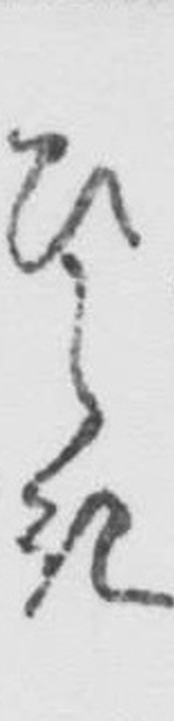ひしき
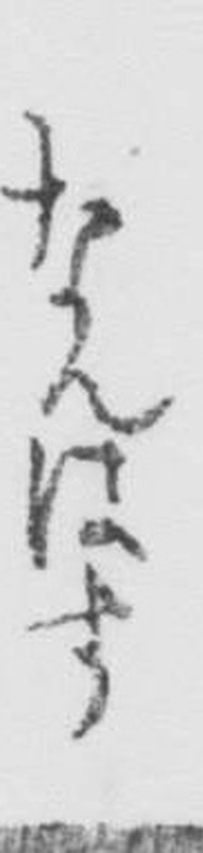なんばす
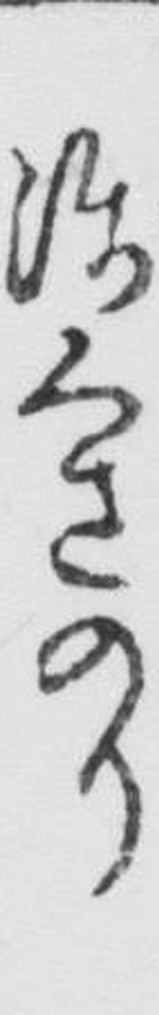浅くさのり
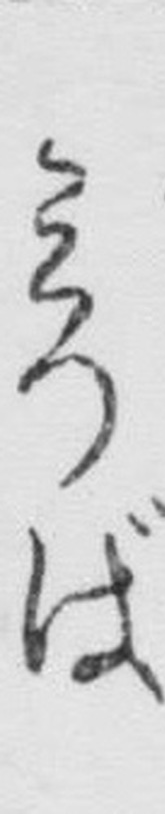みつは
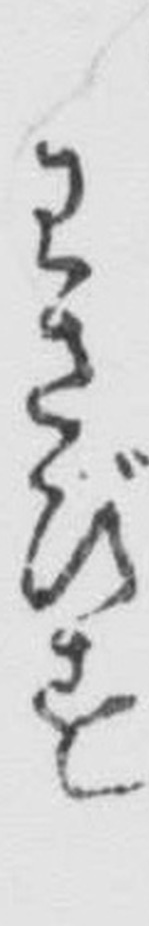わさびす
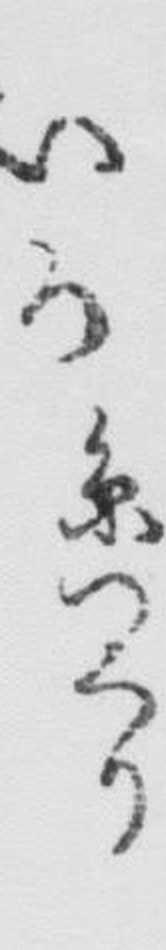いか糸つくり
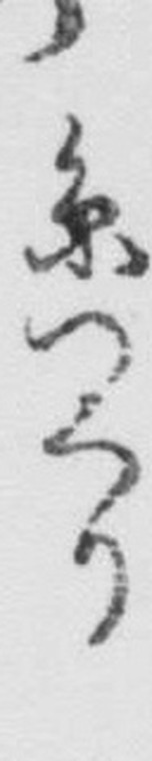糸つくり
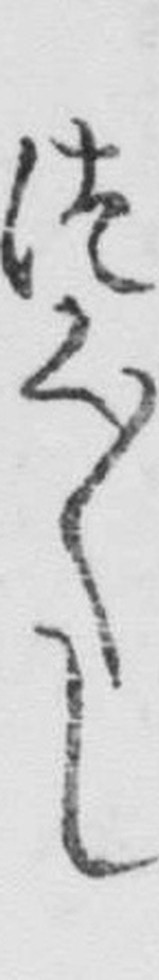つく〳〵し
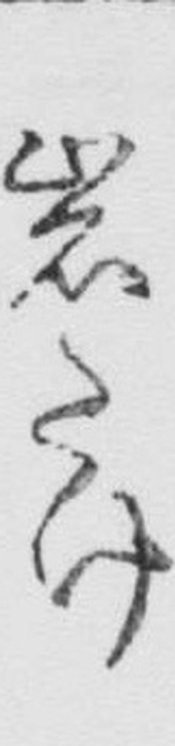岩たけ
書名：諸家通用/即席料理
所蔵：大阪府立大学学術情報センター 国文学研究資料館
